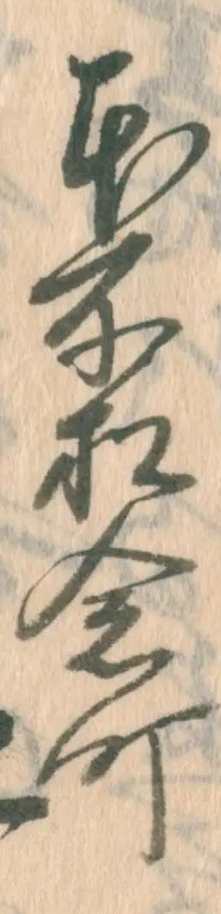本所松倉町
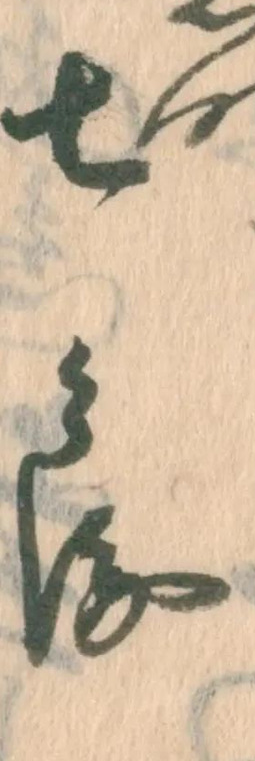七兵衛
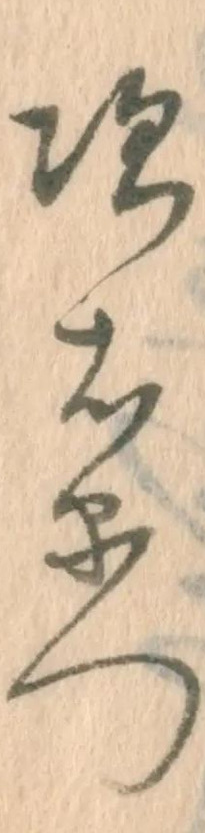次右衛門

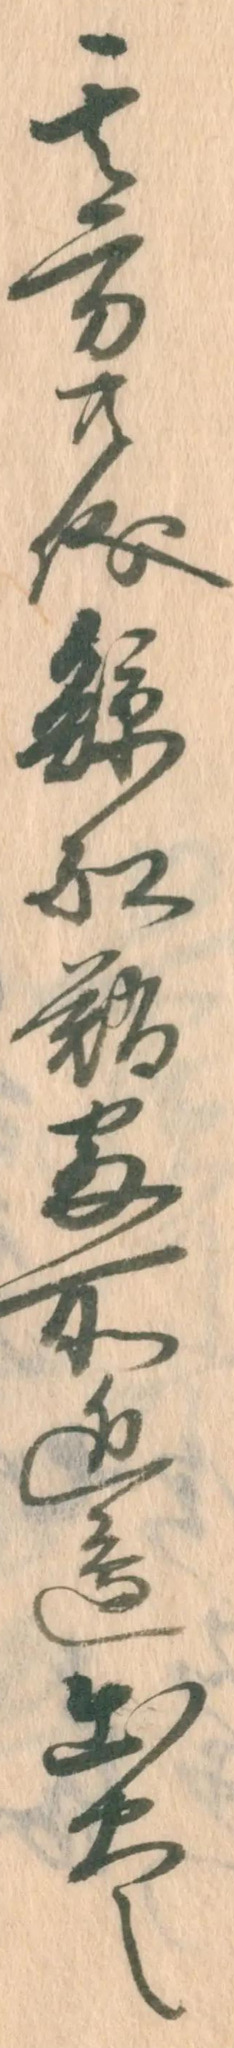其方共儀鯨船鞘番所近辺出火之
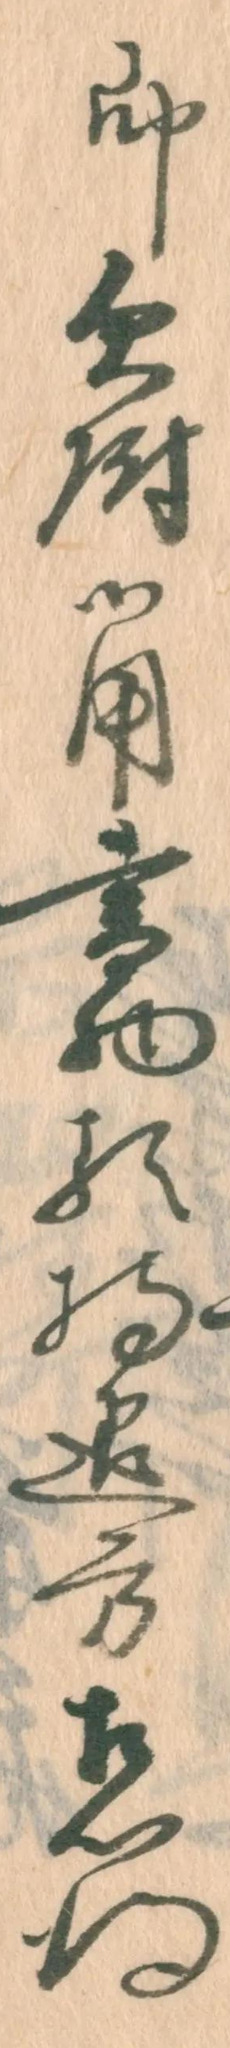節欠附御用書物類持退方相心得
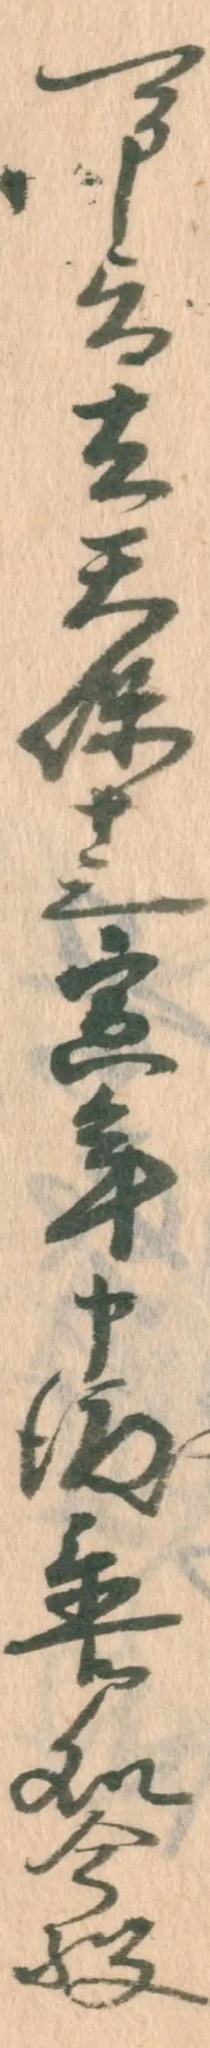可申旨去天保十三寅年申渡置候処今般
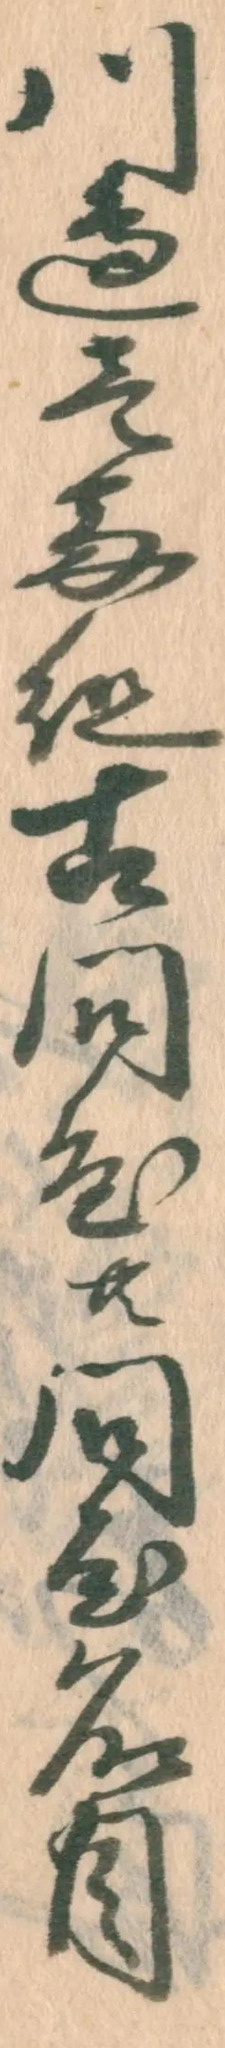川辺壱番組古問屋共問屋名目
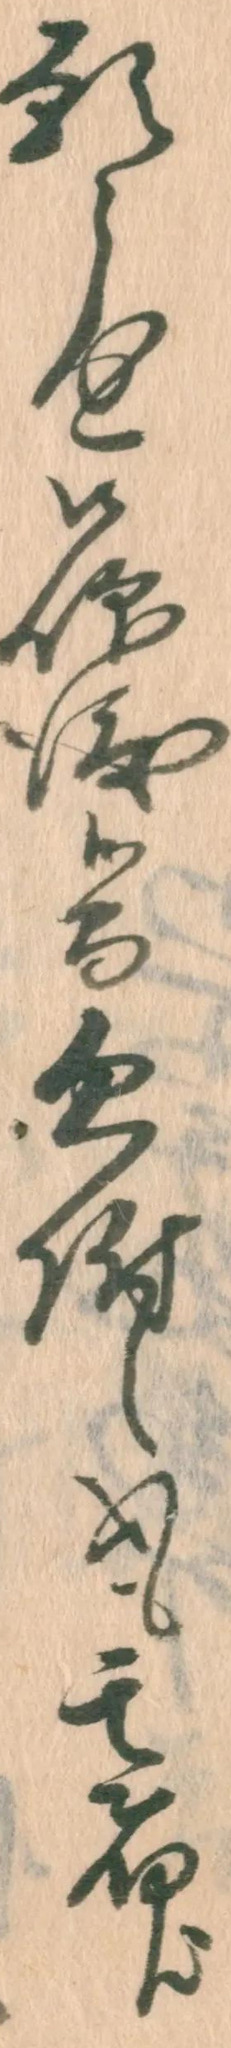願之通被仰渡候而欠附之義も其者え
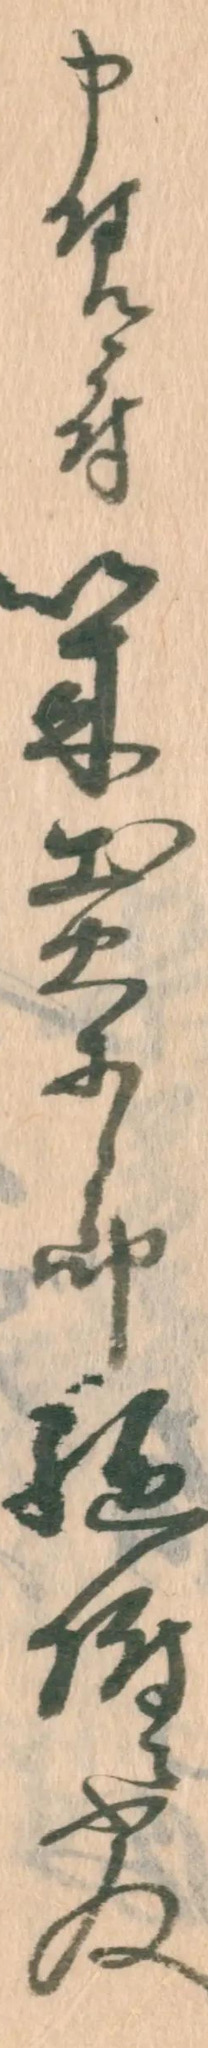申付候ニ付以来出火等之節駆附ニ不及
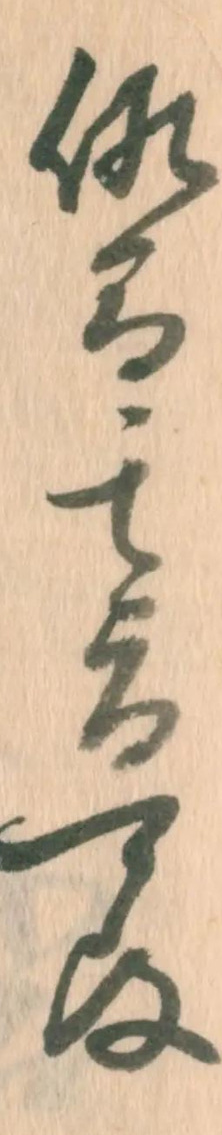仍而其旨可存
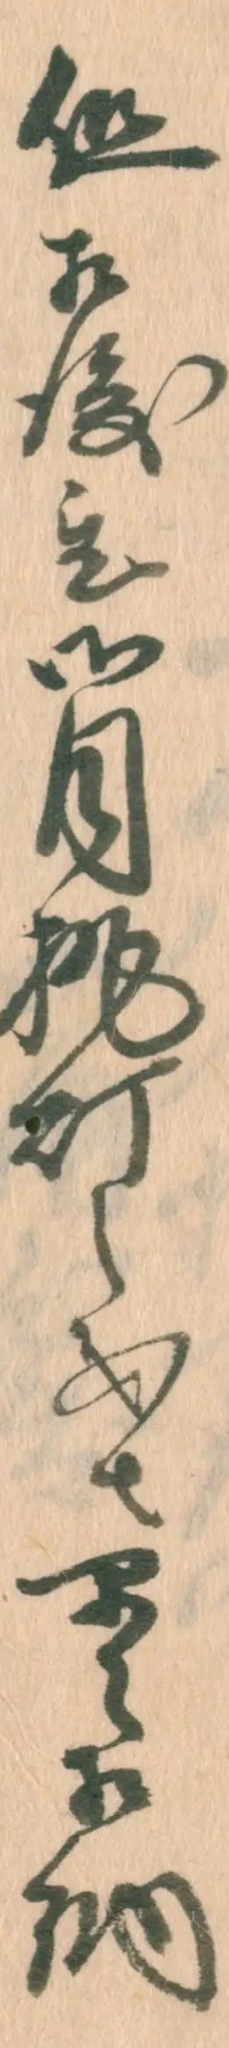但相渡置御月挑灯之義は早々相納
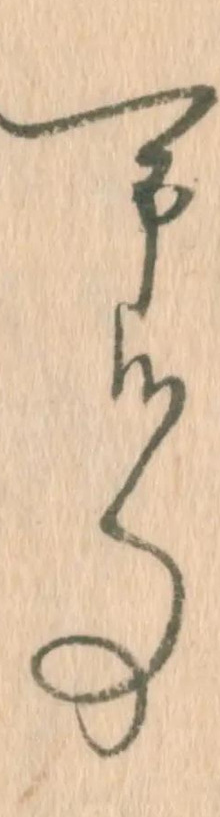可申候事

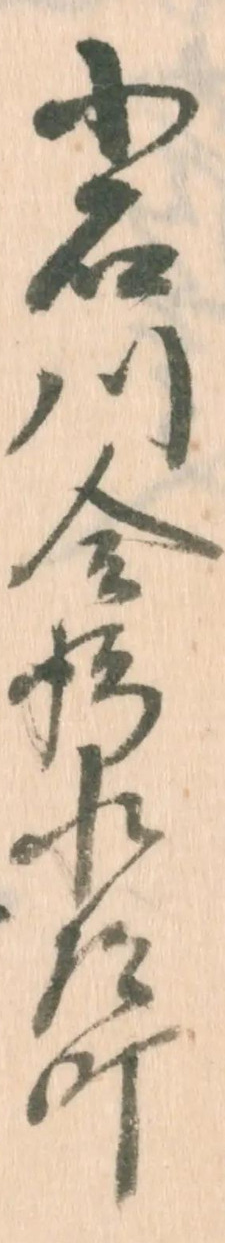小石川金杉水道町
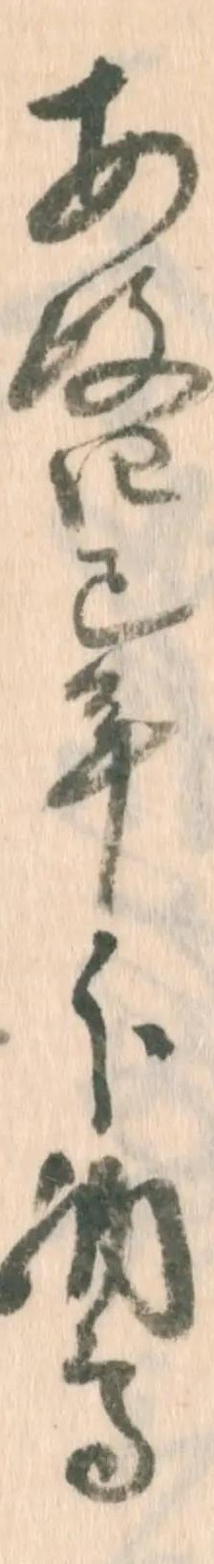安政四巳年分納高
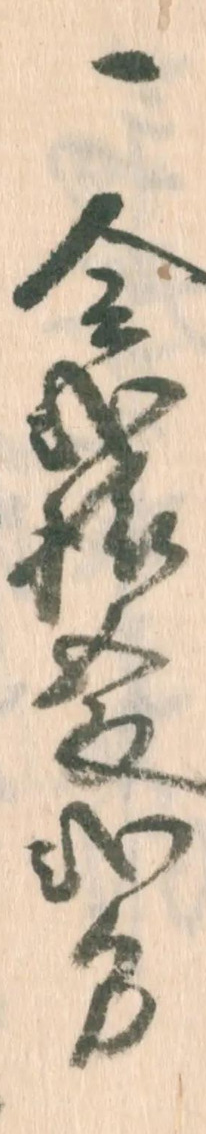一金弐拾五両弐分
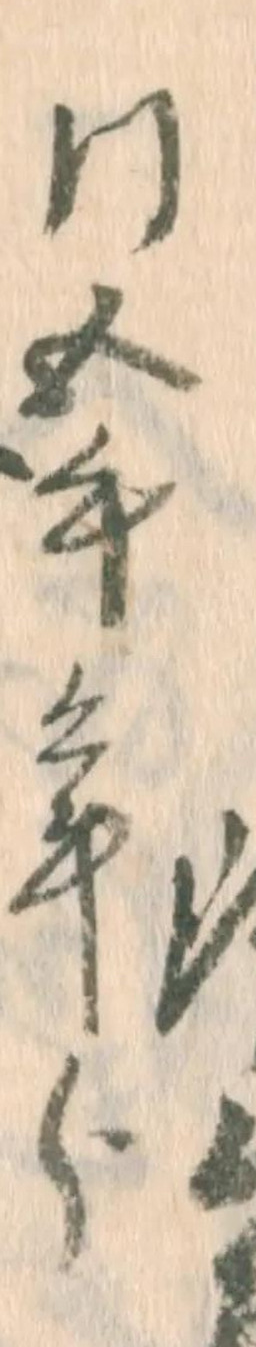同五午年分
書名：地震災書留 2巻. [1] 内表紙に「地震災書留　安政二卯年　但本所深川御用屋敷地代免除調」とあり
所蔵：国立国会図書館 National Diet Library, JAPAN
